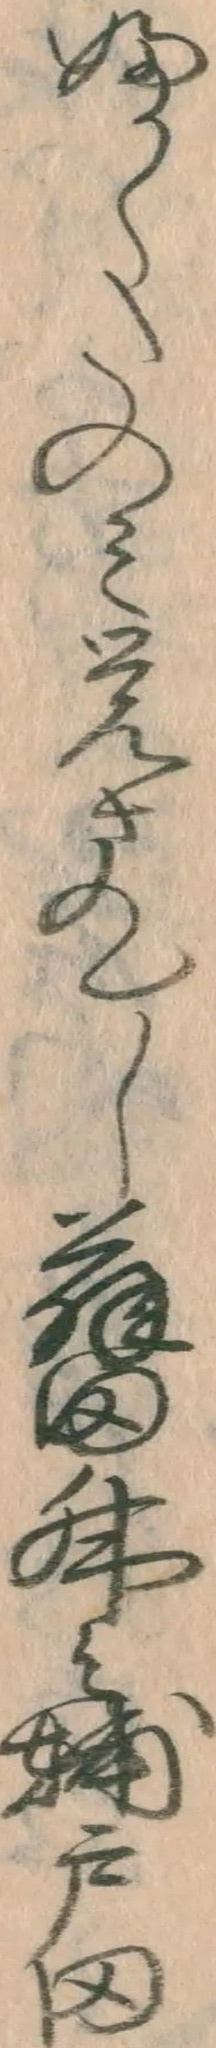ふかくたのミ覚されし藤田虎之輔戸田
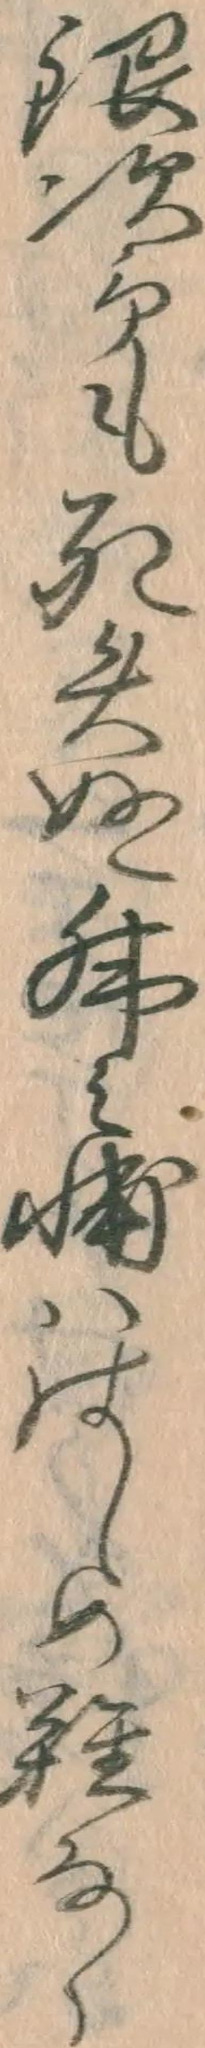銀次郎も死失ぬ虎之輔ハはしめ難なく
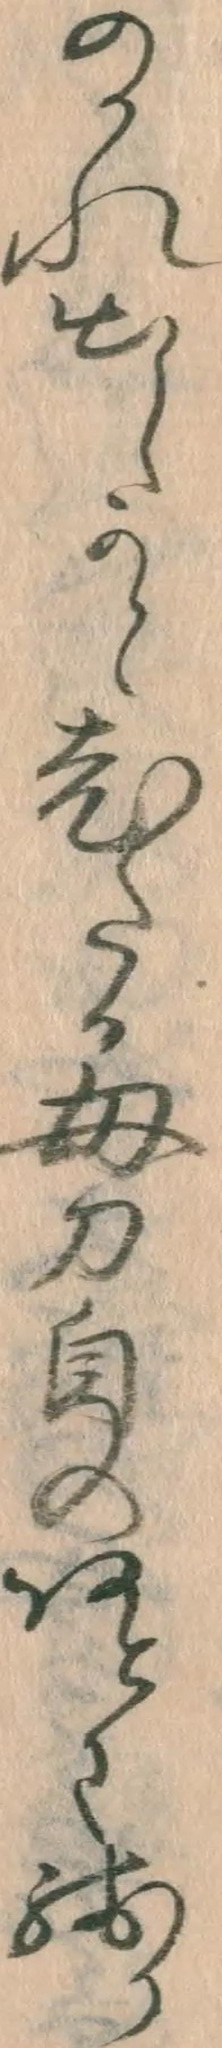のかれ出しかと老たる母刀自のあとに残り
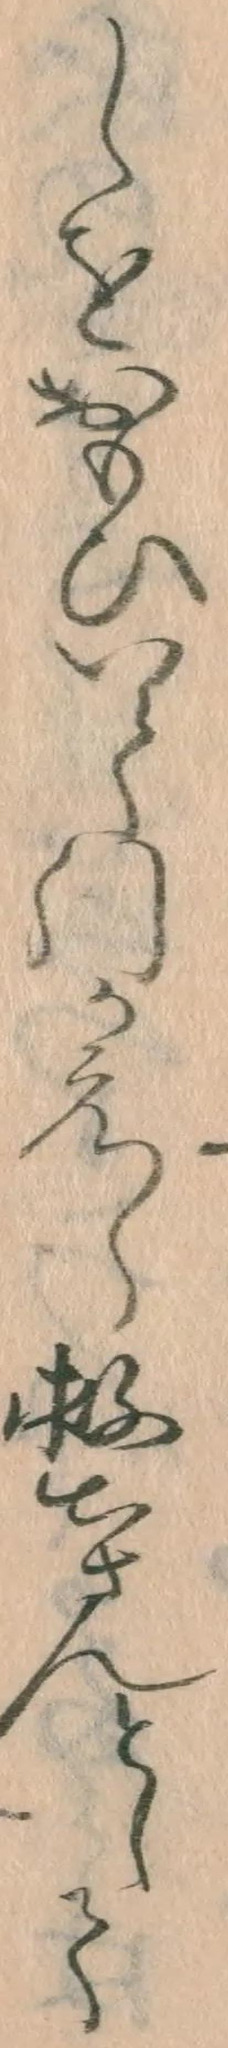しをおもひいて引かえし救出さんとして
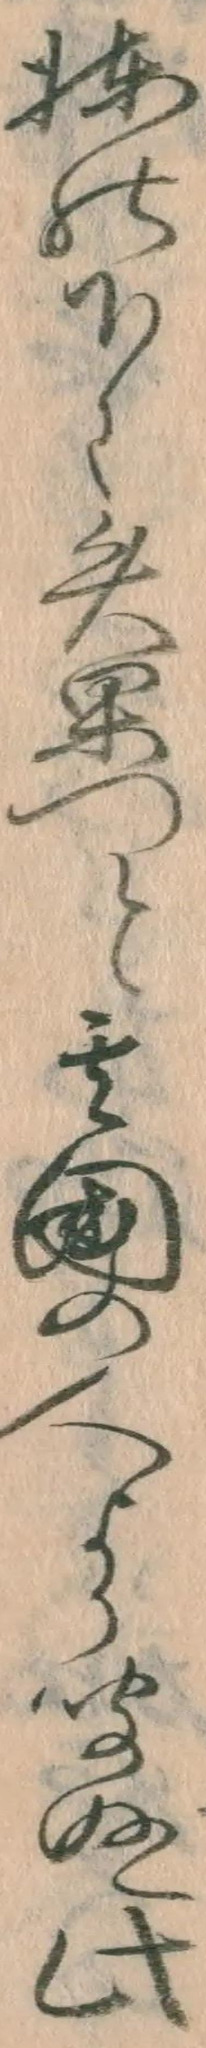軒の下に失果つと其国の人より聞ぬ此
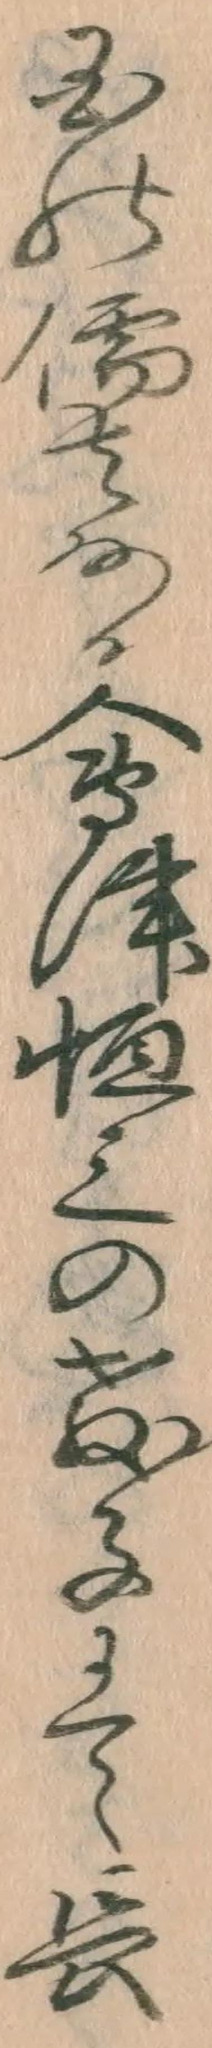国の儒者なる會津恒三の教子にて長
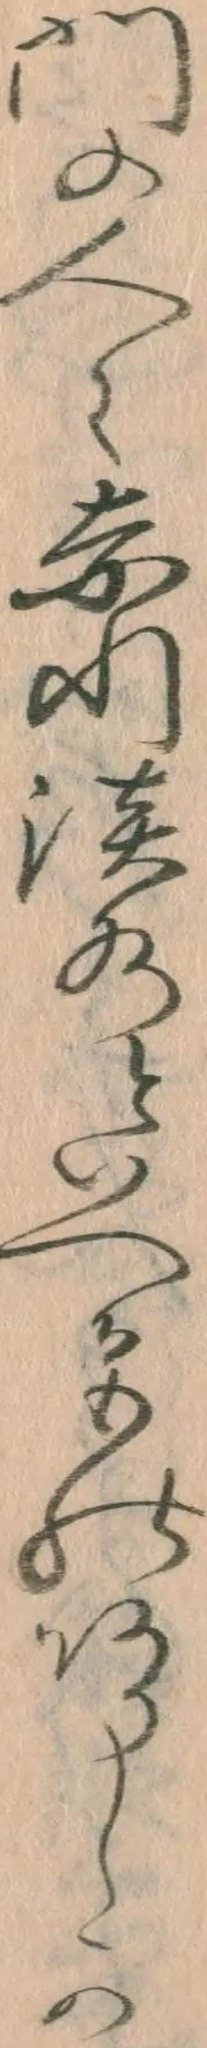門の人に赤川淡水といへるものありしか
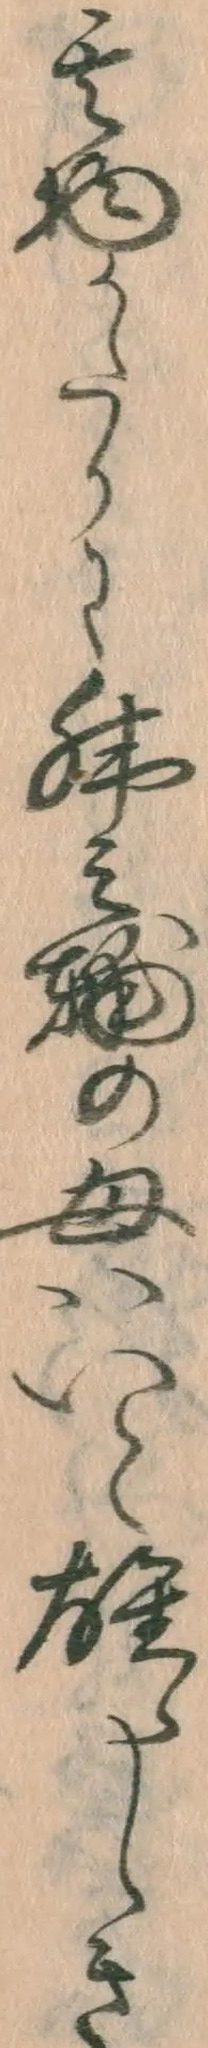其物かたりに虎之輔の母ハいと雄々しき
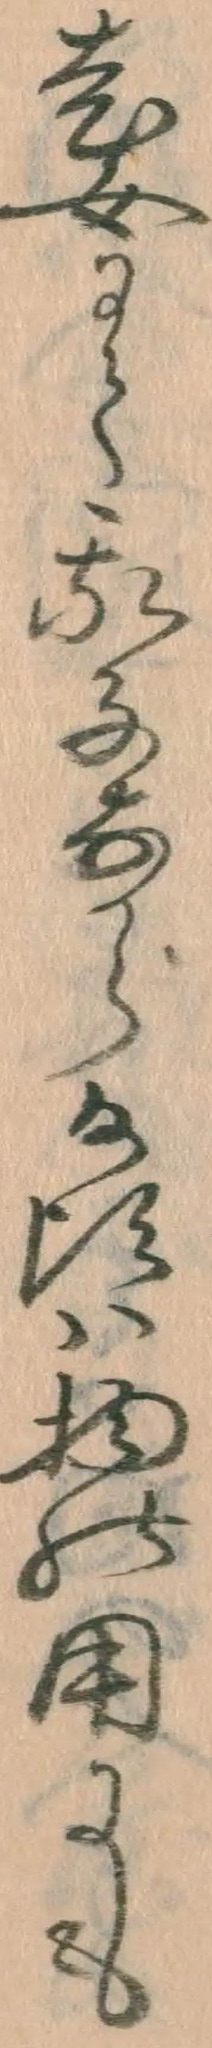老女にて我子なから日頃ハ物の用にも
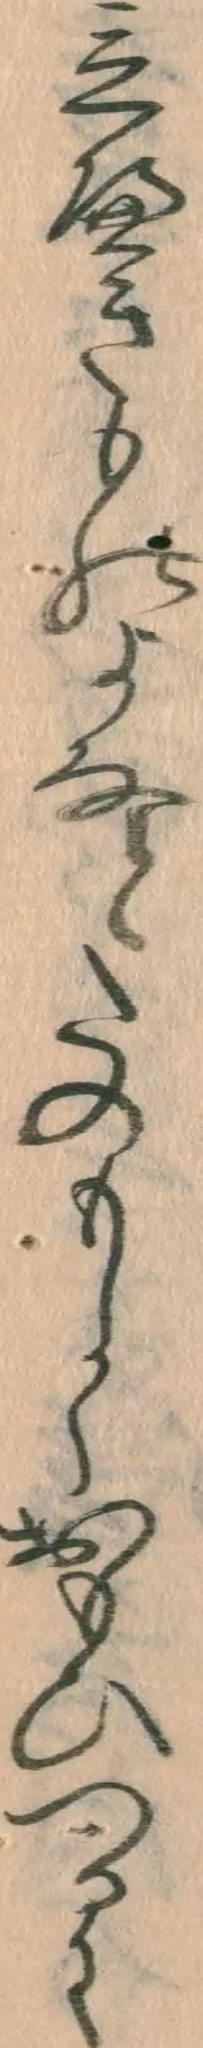立へきものよなとたのもしくおもひつるに
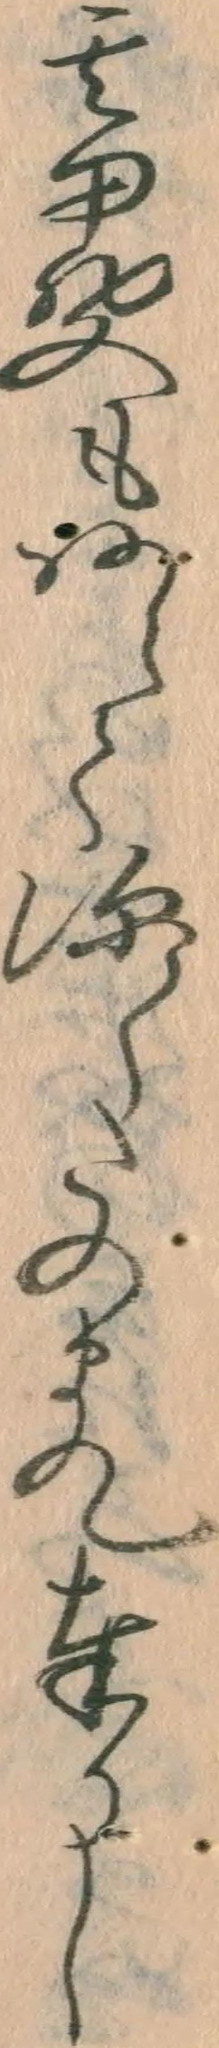其甲斐もあらて深くたのまれ奉りし
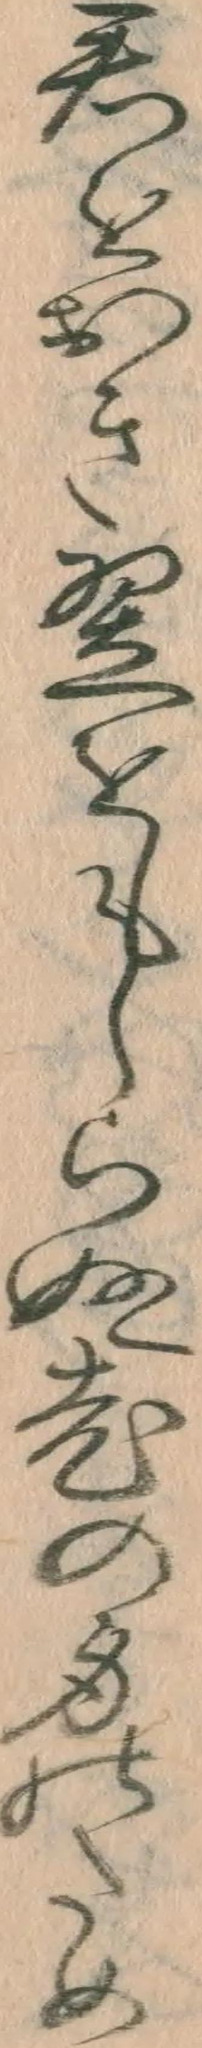君をおき翌をもしらぬ老の身のため
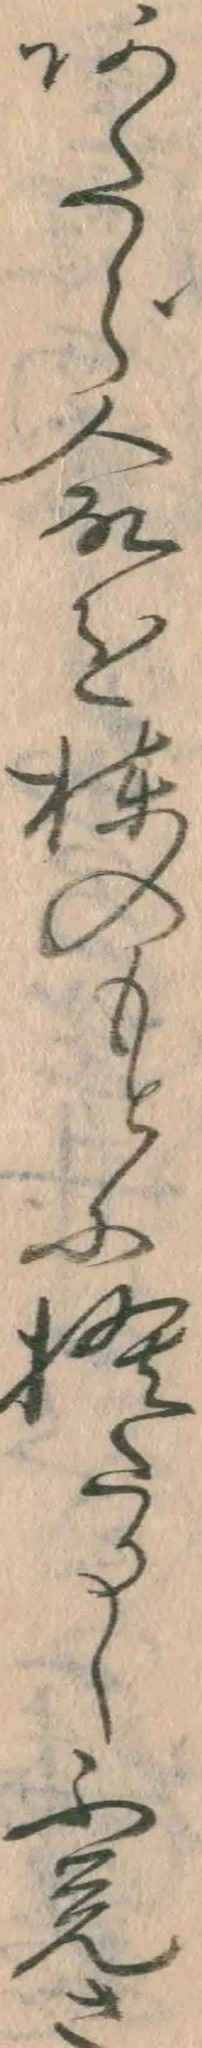あたら命を棟のもとに捨たりし不覚さ
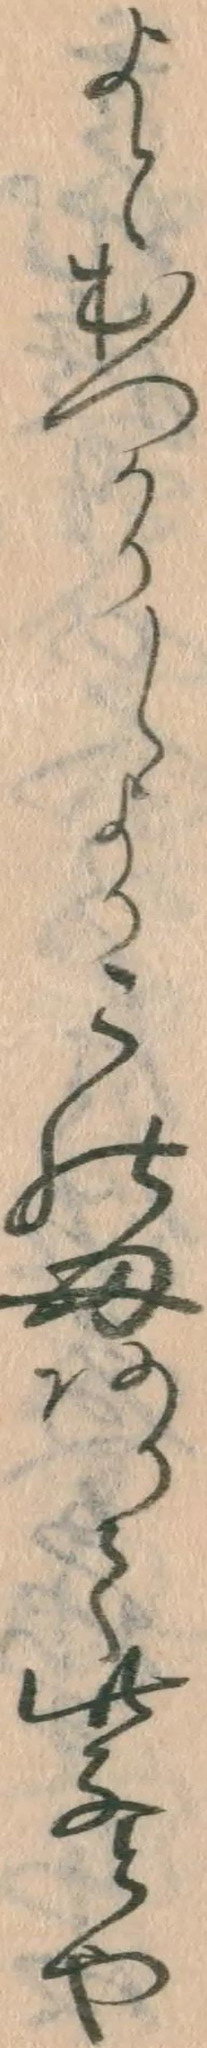よとむつかりしよりこの母ありて此子とや
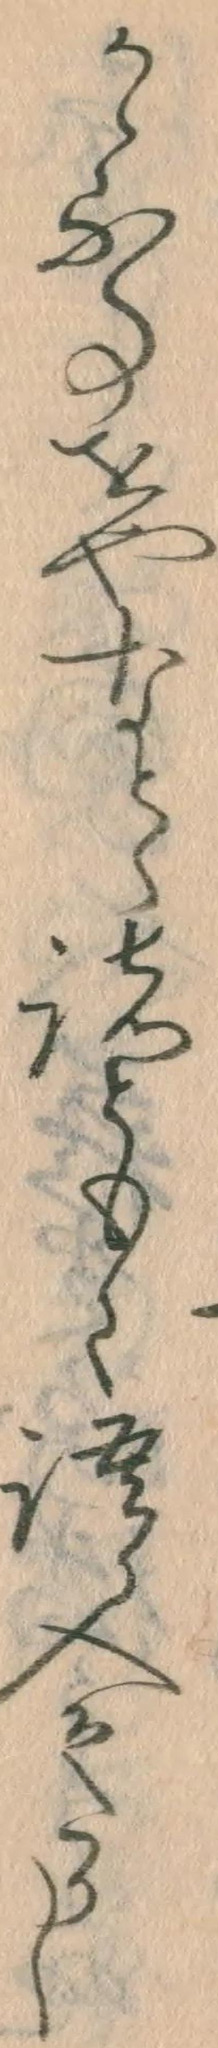かゝる事をやなとゝ諸ともに語り合たりし
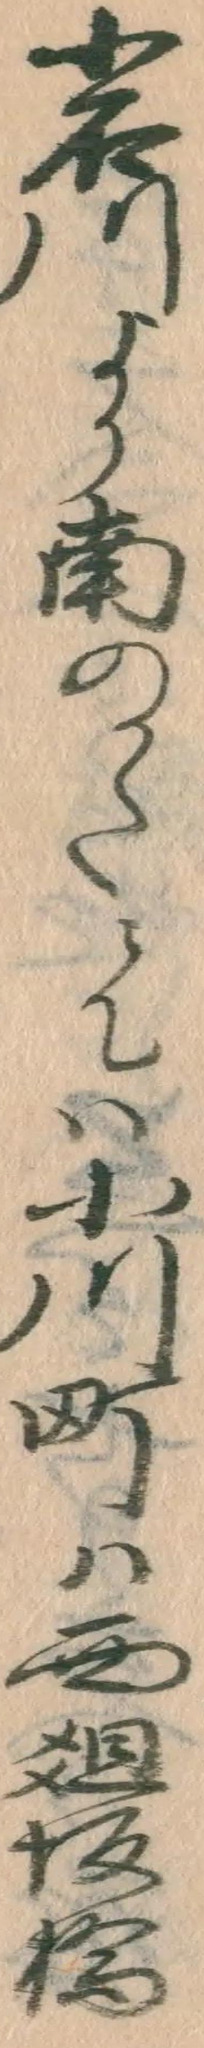小石川より南のかたニてハ小川町ハ西俎板橋
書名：麗斎叢書. 20
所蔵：国立国会図書館 National Diet Library, JAPAN
